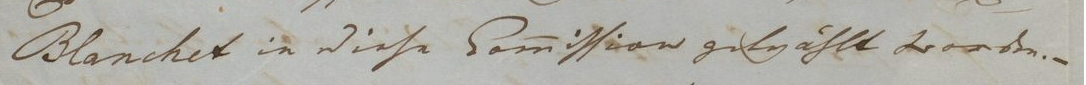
Blanchet in diese Commission gewählt worden. –
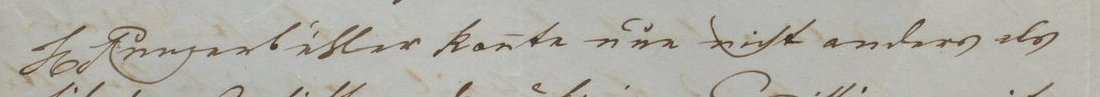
Herr Hungerbühler konnte nun nicht anders als
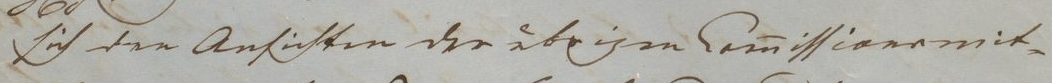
sich den Ansichten der übrigen Commissionsmit-
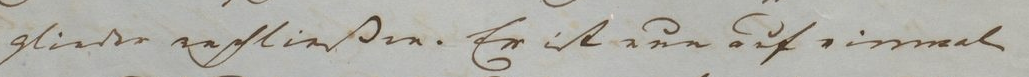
glieder anschließen. Er ist nun auf einmal
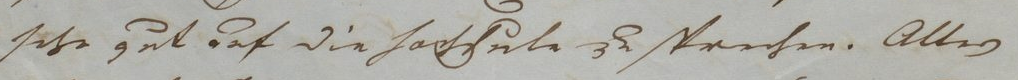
sehr gut auf die Hochschule zu sprechen. Alles
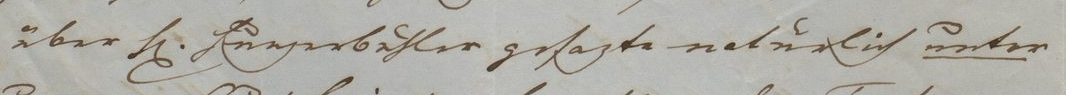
über H. Hungerbühler gesagte natürlich unter
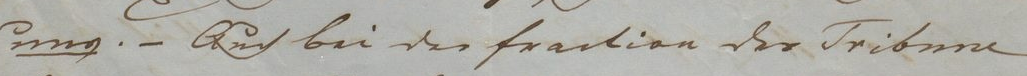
uns. – Auch bei der Fraction der Tribune
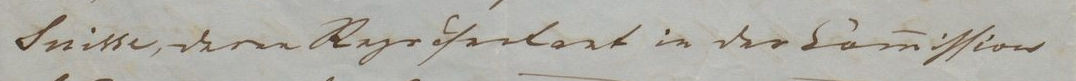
Suisse, deren Repräsentant in der Commission
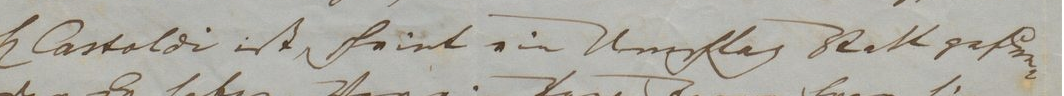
Castoldi ist, scheint ein Umschlag Statt gefun-
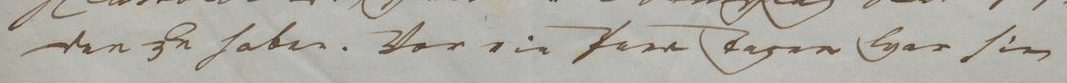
den zu haben. Vor ein Paar Tagen war sie
